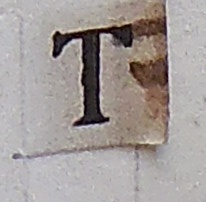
T
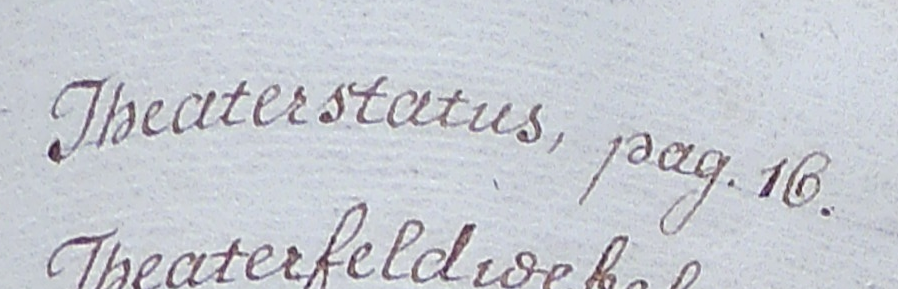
Theaterstatus, pag. 16.
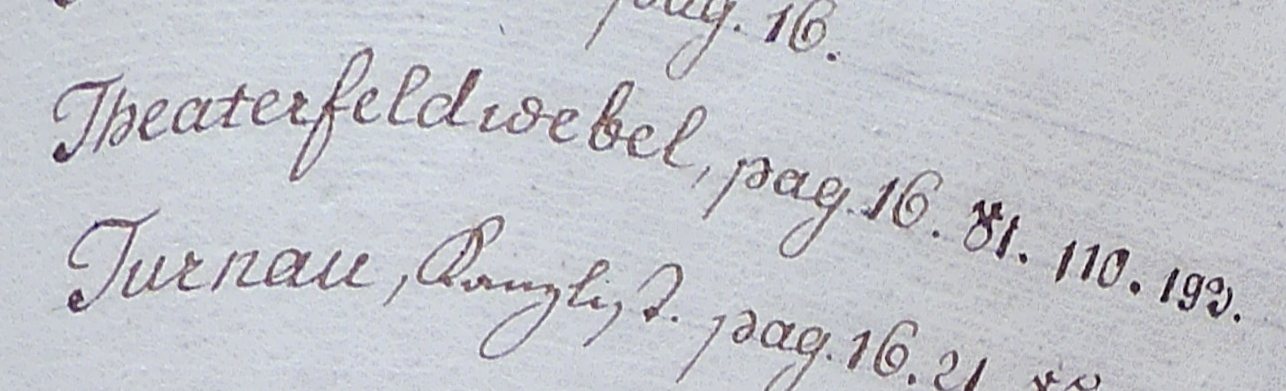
Theaterfeldwebel, pag. 16. 81. 110. 193.
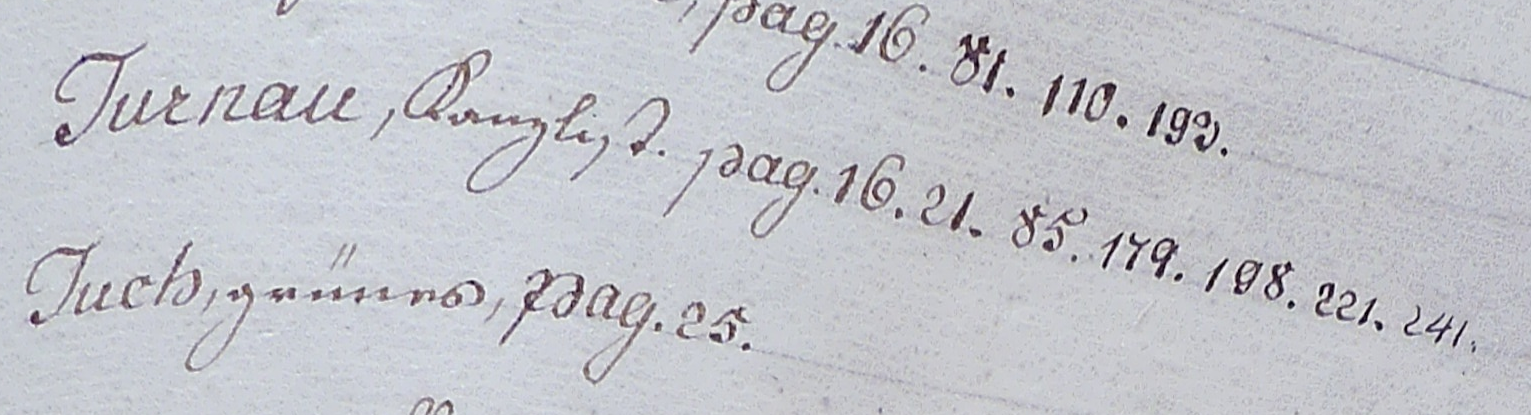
Turnau, Kanzlist. pag. 16. 21. 85. 179. 198. 221. 241.
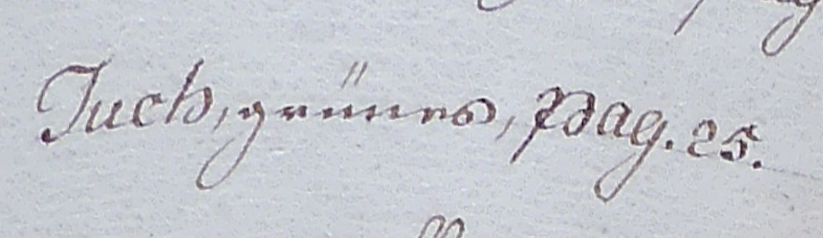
Tuch, grünes, pag. 25.
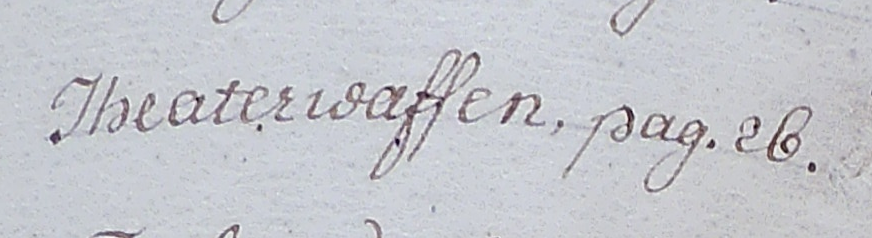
Theaterwaffen, pag. 26.
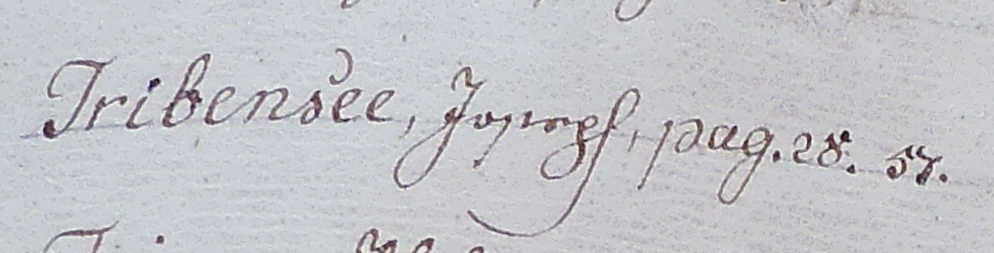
Tribensee, Joseph, pag. 28. 57.
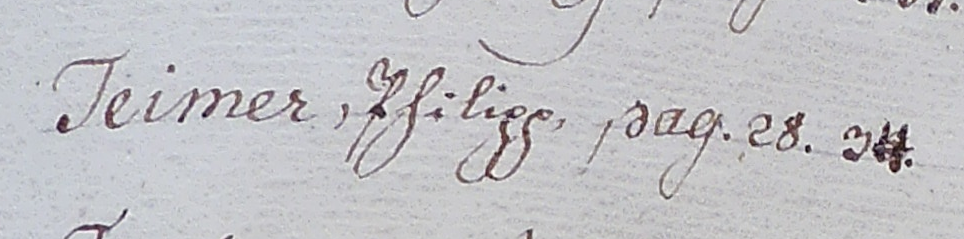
Teimer, Philipp, pag. 28. 34.
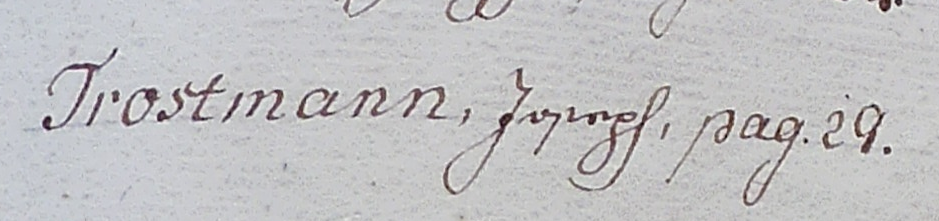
Trostmann, Joseph, pag. 29.
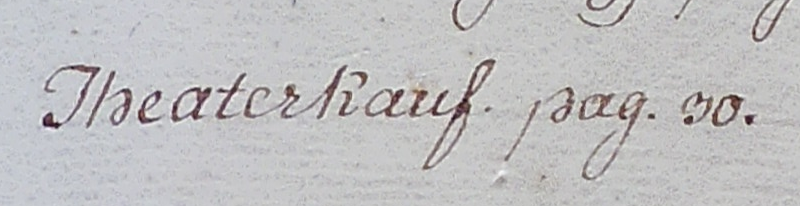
Theaterkauf. pag. 30.
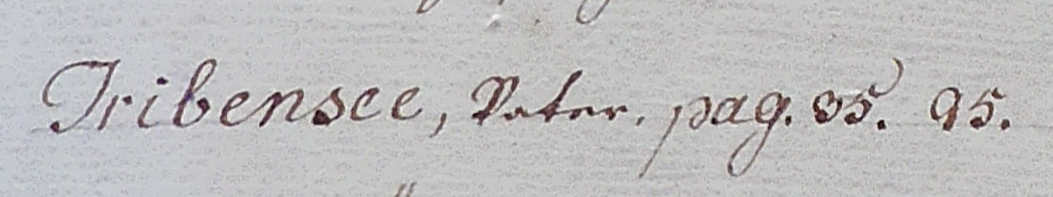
Tribensee, Vater, pag. 35. 95.
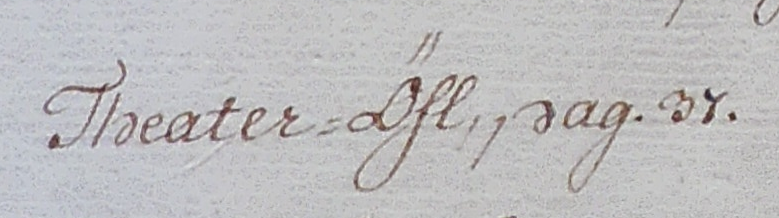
Theater-Öhl, pag. 37.
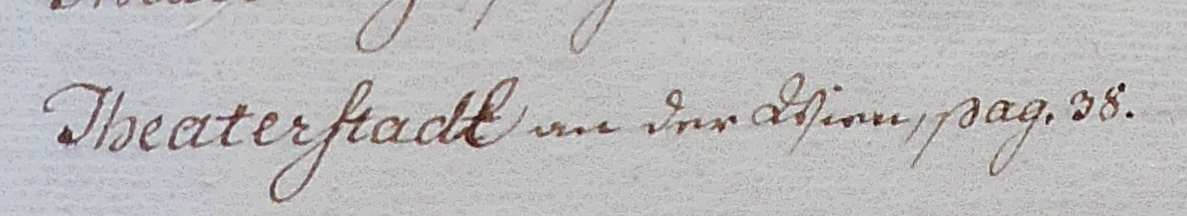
Theaterstadl an der Wien, pag. 38.
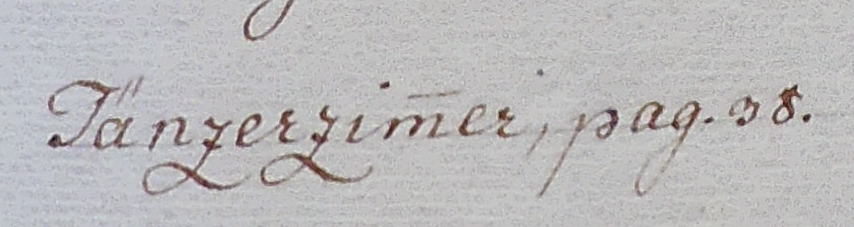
Tänzerzim̅er, pag. 38.
